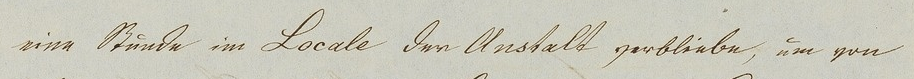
eine Stunde im Locale der Anstalt verbliebe, um von
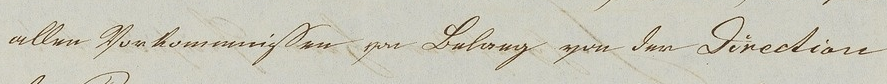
allen Vorkommnissen von Belang von der Direction
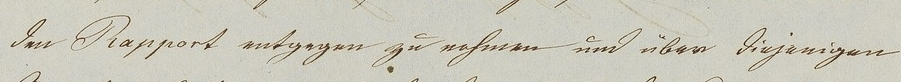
den Rapport entgegen zu nehmen und über diejenigen
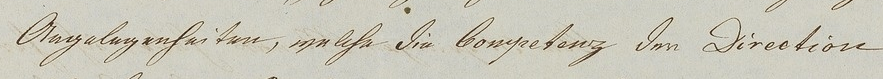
Angelegenheiten, welche die Competenz der Direction
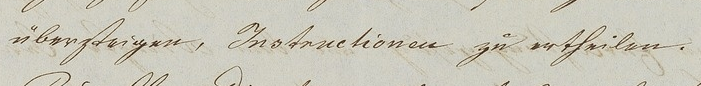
übersteigen, Instructionen zu ertheilen.
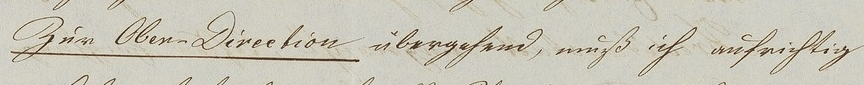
Zur Ober-Direction übergehend, muß ich aufrichtig
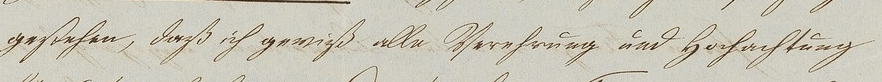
gestehen, daß ich gewiß alle Verehrung und Hochachtung
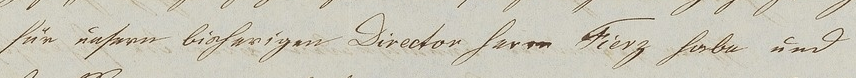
für unsern bisherigen Director Herrn Fierz habe und
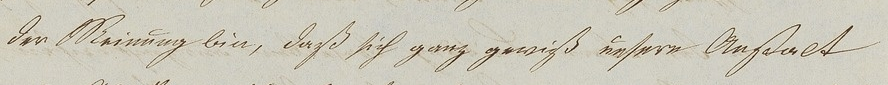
der Meinung bin, daß sich ganz gewiß unsere Anstalt
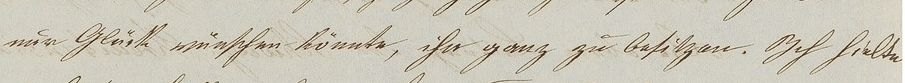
nur Glück wünschen könnte, ihn ganz zu besitzen. Ich hielte
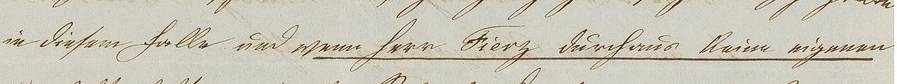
in diesem Falle und wenn Herr Fierz durchaus keine eigenen
